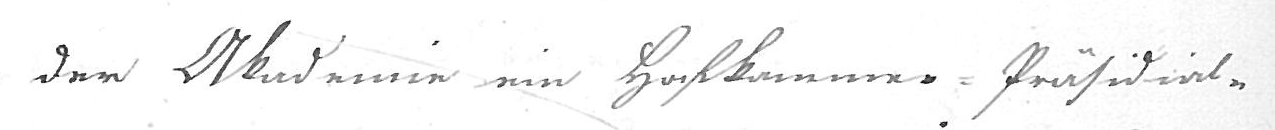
der Akademie ein Hofkammer-Präsidial-
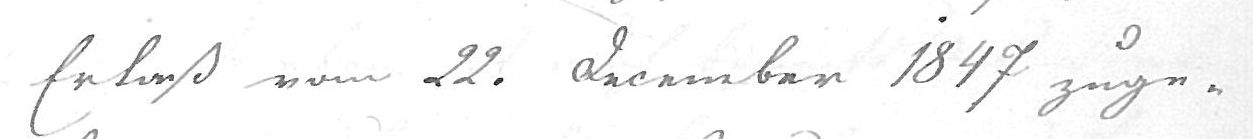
Erlaß vom 22. December 1847 zuge-
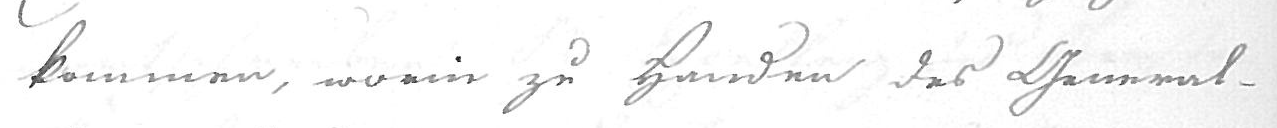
kommen, worin zu Handen des General-
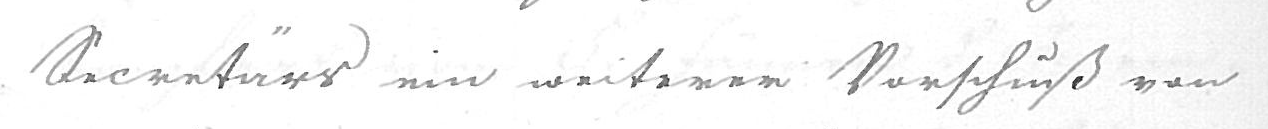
Secretärs ein weiterer Vorschluß von
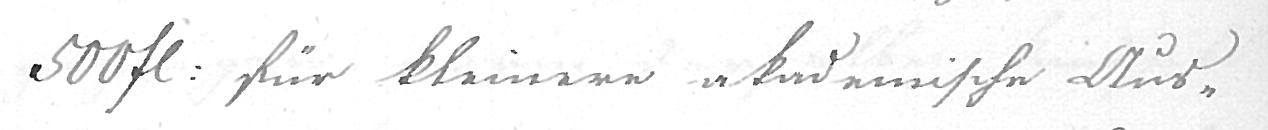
500 fl. für kleinere akademische Aus-
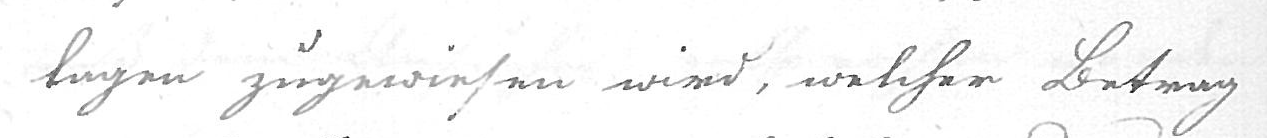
lagen zugewiesen wird, welcher Betrag
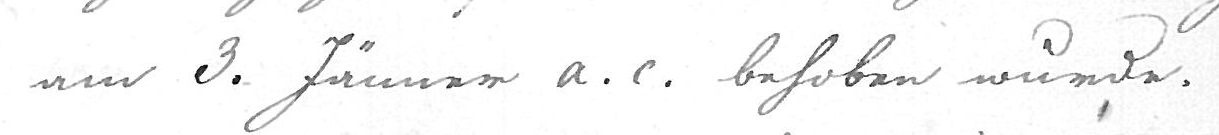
am 3. Jänner a.c. behoben wurde.
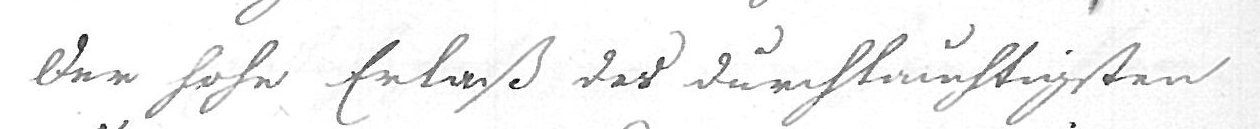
Der hohe Erlaß des durchlauchtigsten
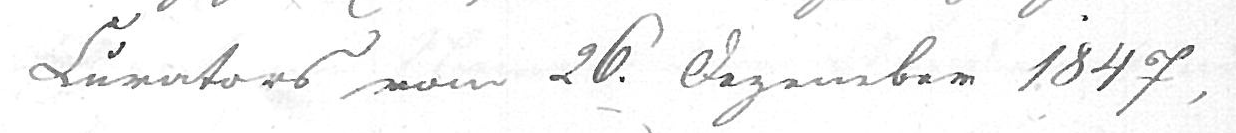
Curators vom 26. Dezember 1847,
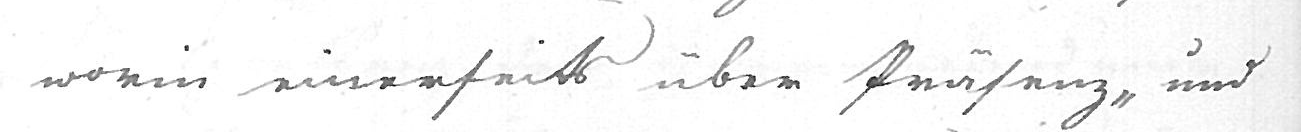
worin einerseits über Präsenz- und
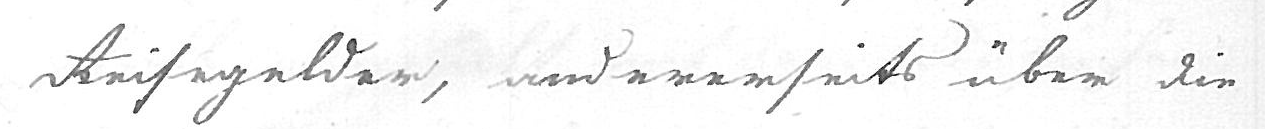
Reisegelder, andererseits über die
